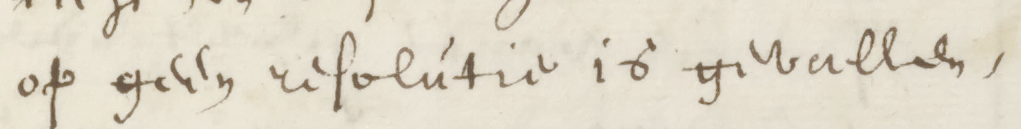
op geen resolutie is gevallen.
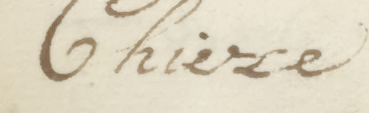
Chieze
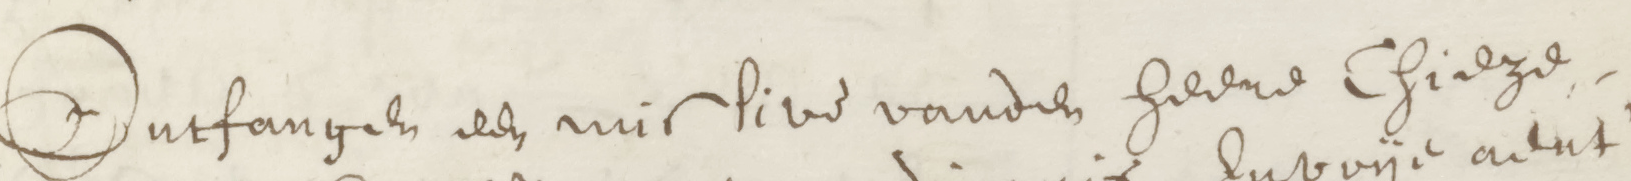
Ontfangen een missive vanden heere Chieze
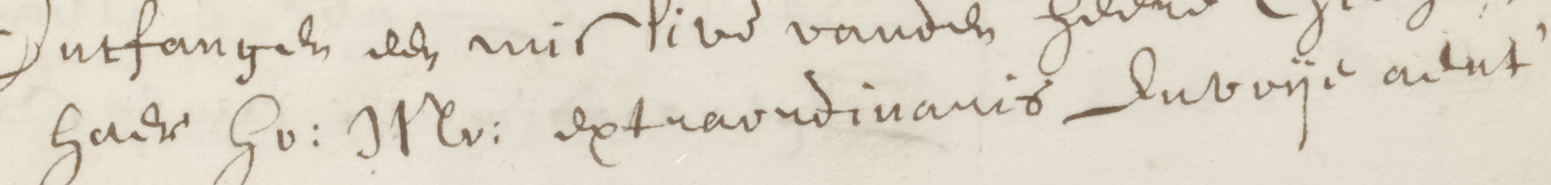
haer ho:Mo: extraordinaris Envoijé aent‛
